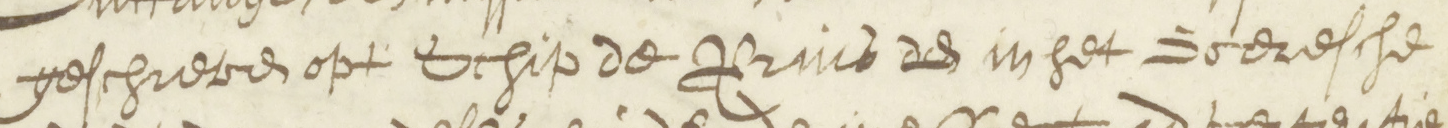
geschreven opt' Schip de Prins den in het Goeresche
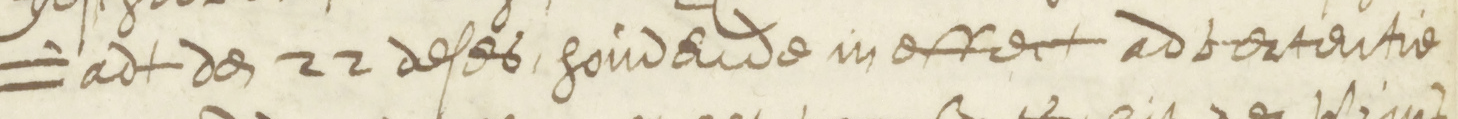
Gadt den 22 deses, houdende in effect advertentie
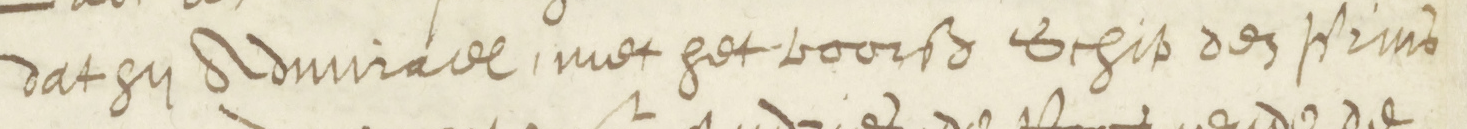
dat hy Admirael, met het voorsz Schip den Prins
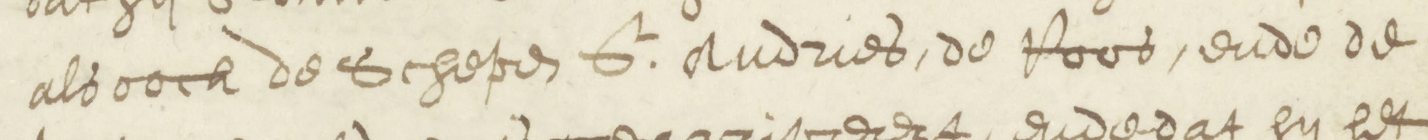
als oock de Schepen St. andries, de Roos, ende de
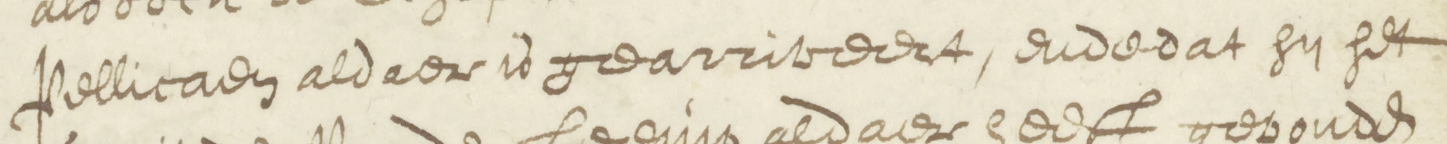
Pellicaen aldaer is gearriveert, ende dat hy het
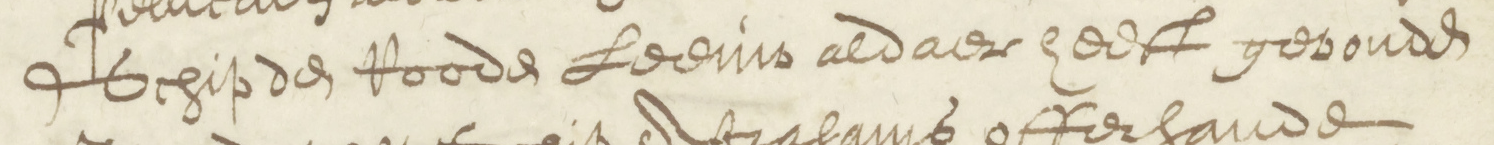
Schip den Rooden Leeuw aldaer heeft gevonden
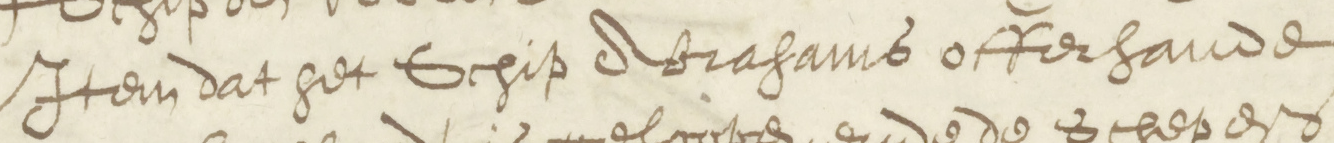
Item dat het Schip Abrahams offerhande
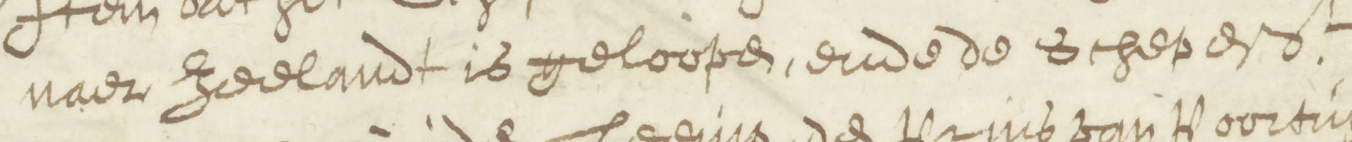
naer Zeelandt is geloopen, ende de Schepen st
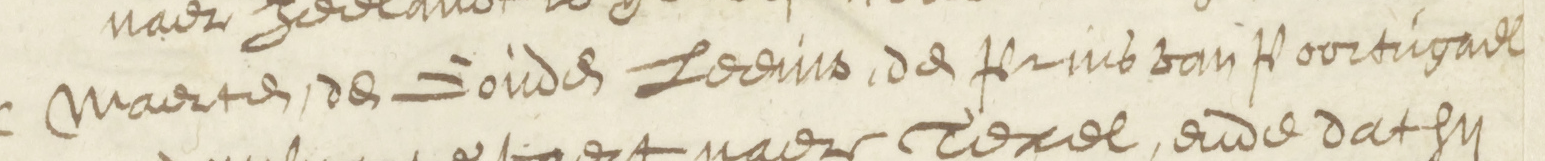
Maerten, den Gouden Leeuw, den Prins van Poortugael
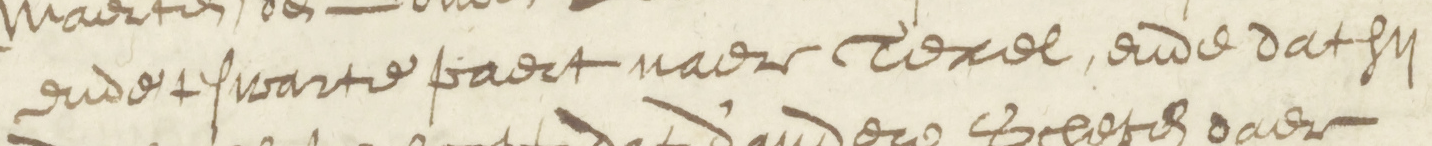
ende t swarte paert naer Texel, ende dat hy
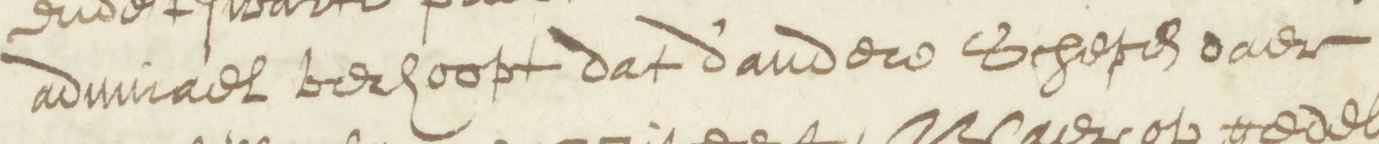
admirael verhoopt dat d'andere Schepen daer
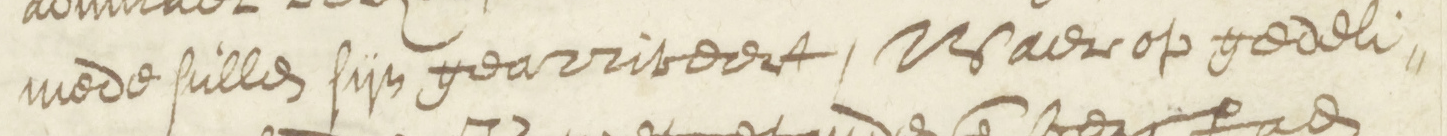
mede sullen sijn gearriveert. Waerop gedeli„
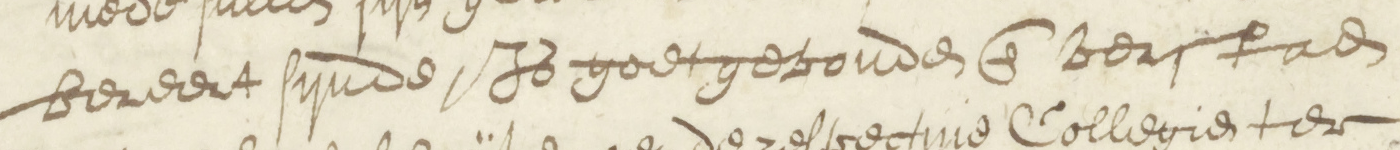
bereert synde, Is goetgevonden & verstaen
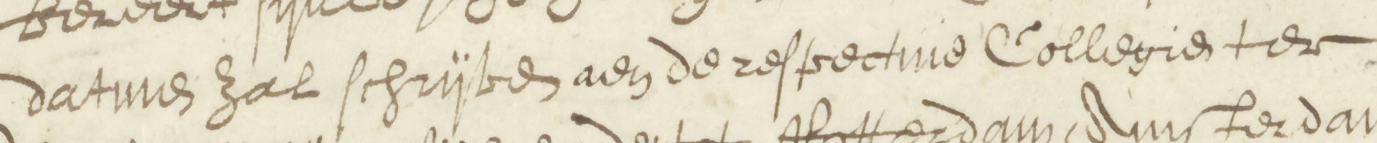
datmen zal schrijven aen de respectiue Collegien ter
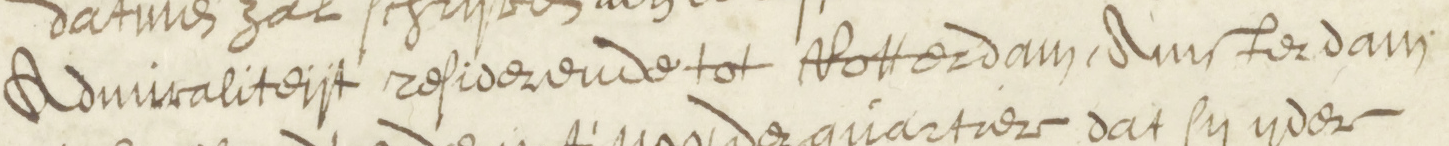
Admiraliteijt residerende tot Rotterdam, Amsterdam
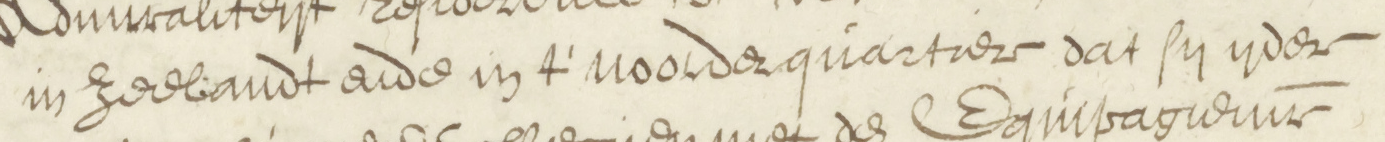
in Zeelandt ende in t' noorderquartier dat sy yder
